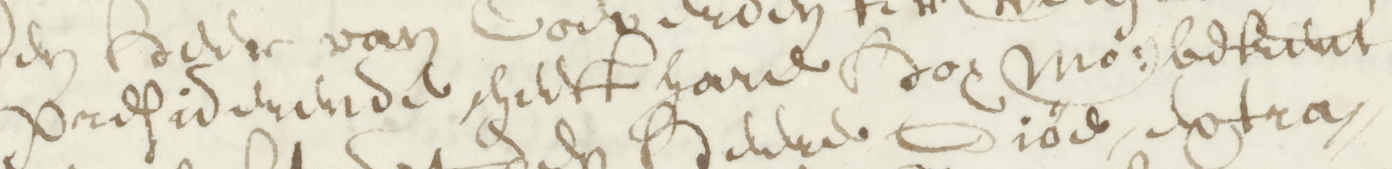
presiderende, heeft hare Ho:Mo: bekent
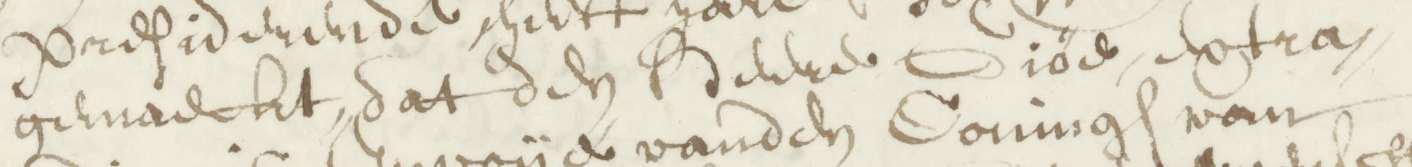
gemaeckt, dat den Heere Giöe, extra,,
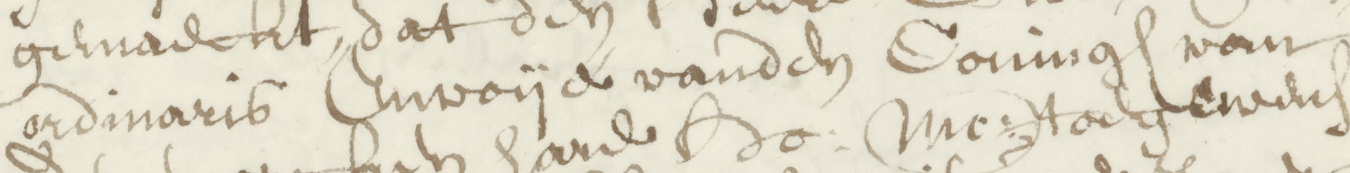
ordinaris Envoijé vanden Coningh van
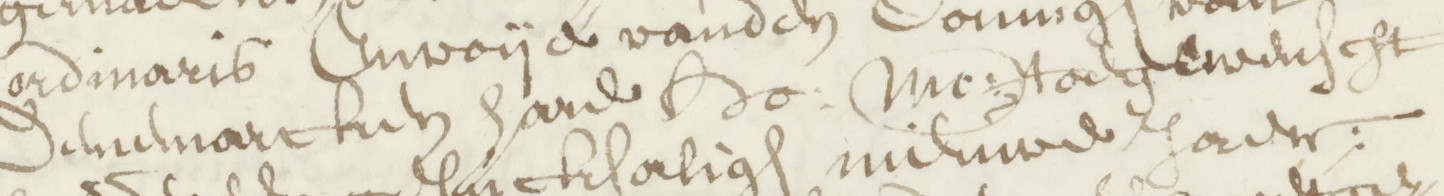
Denemarcken hare Ho:Mo: toegewenscht
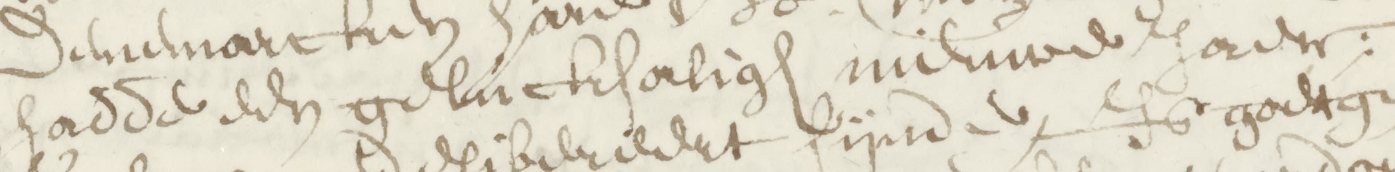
hadde een gelucksaligh nieuwe Jaer:
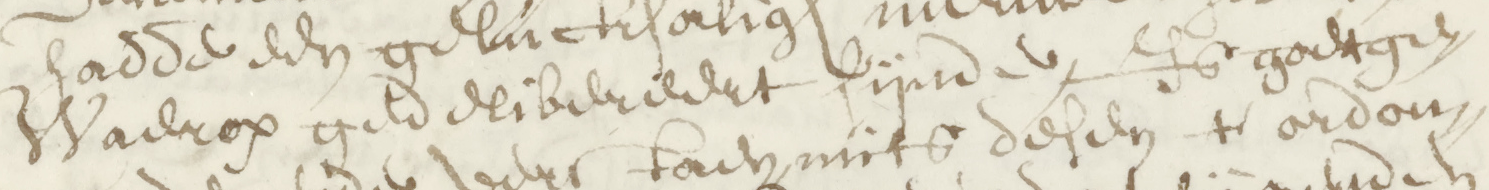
Waerop gedelibereert sijnde, Is goetge„
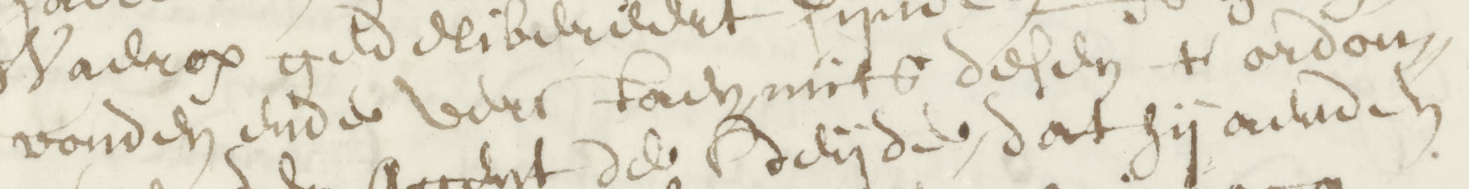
vonden ende verstaen, mits desen t' ordon„,
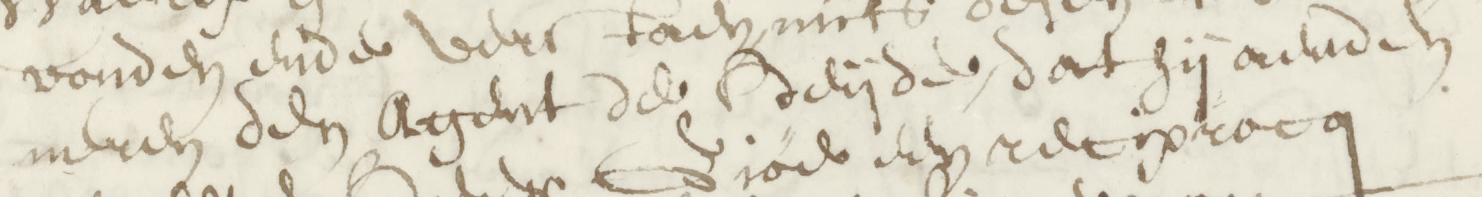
neren den Agent de Heijde, dat hij aenden
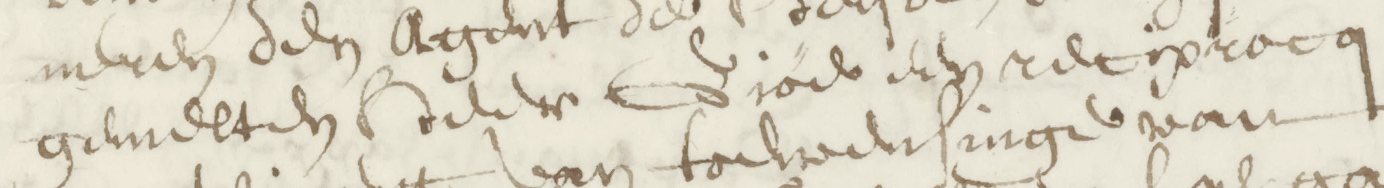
gemelten Heer Giöe een reciprocq
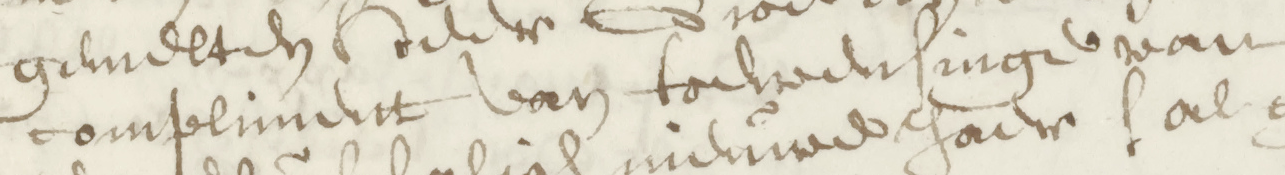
compliment van toewensinge van
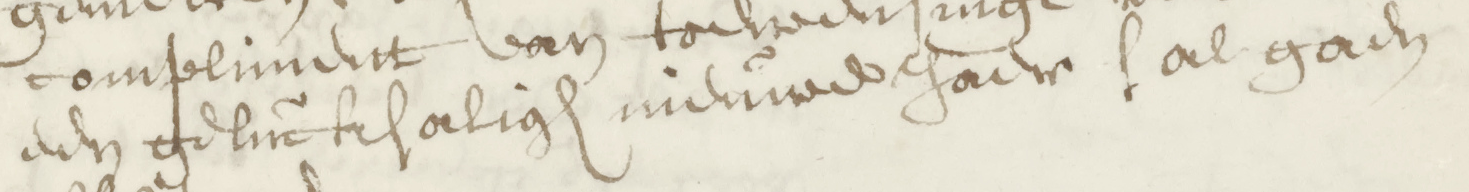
een gelucksaligh nieuwe jaer sal gaen
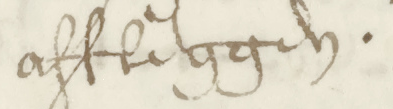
affleggen.
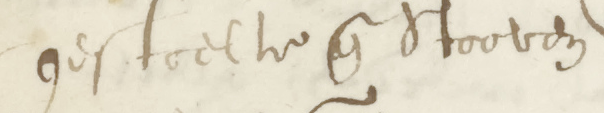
gestoelte & stooven
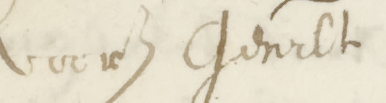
voors Genrlt
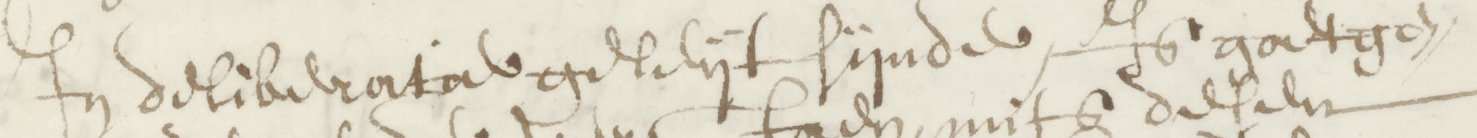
In deliberatie geleijt sijnde, Is goetge„
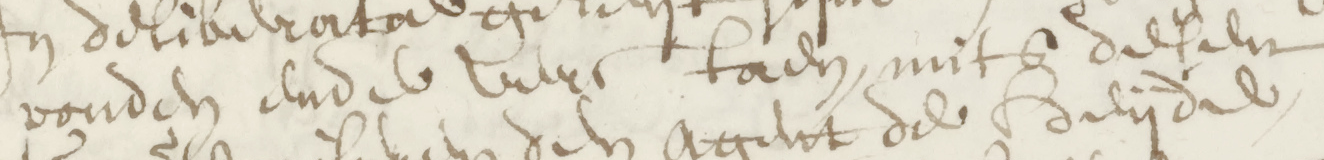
vonden ende verstaen, mits desen
